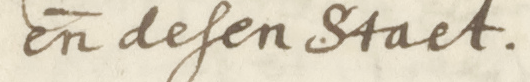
en desen Staet.
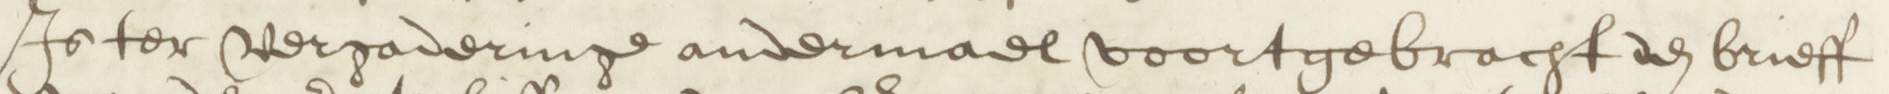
Is ter vergaderinge andermael voortgebracht den brieff
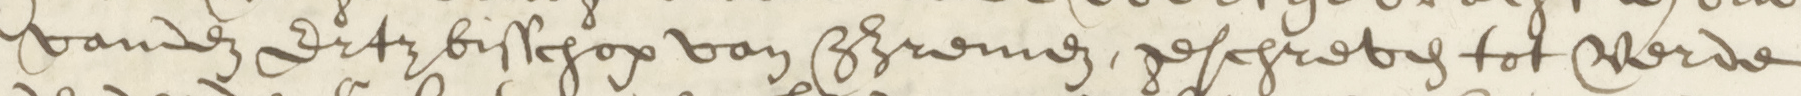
vanden Ertzbisschop van Bremen, geschreven tot Verde
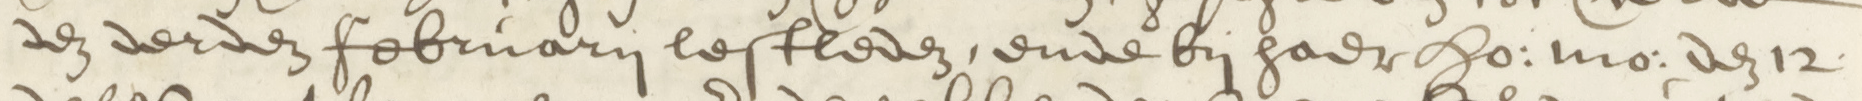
den derden februarij lestleden, ende bij haer Ho:mo den 12
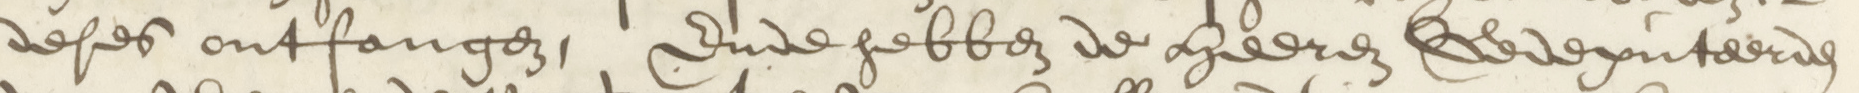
deses ontfangen. Ende hebben de Heeren gedeputeerden
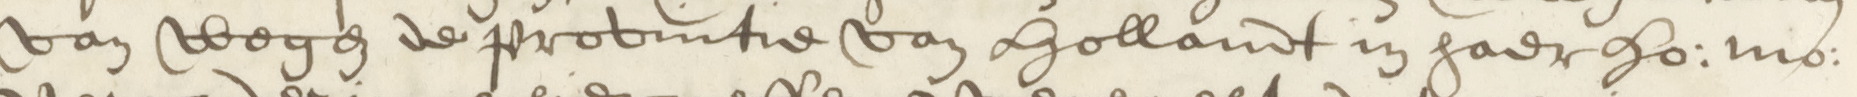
van wegen de Provintie van Hollandt in haer Ho:mo:
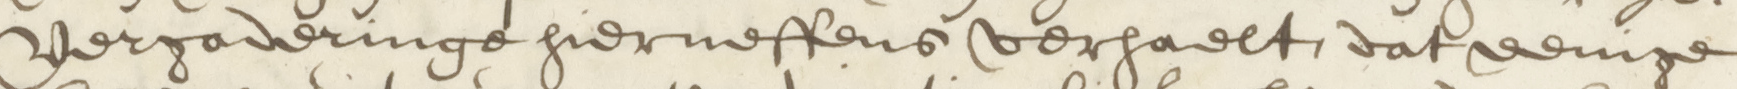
Vergaderinge hierneffens verhaelt, dat eenige
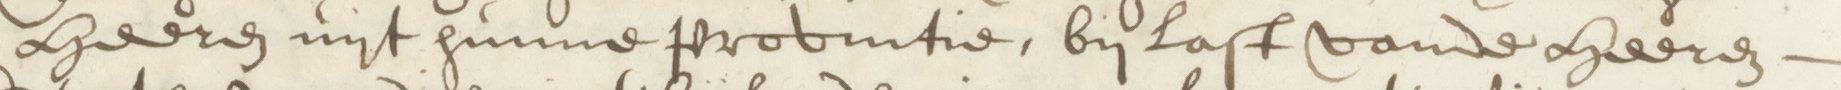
Heeren uijt hunne Provintie, bij last van de heeren —
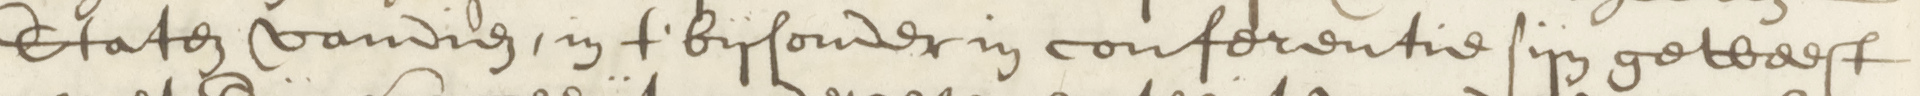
Staten vandien, in t‛ bijsonder in conferentie sijn geweest
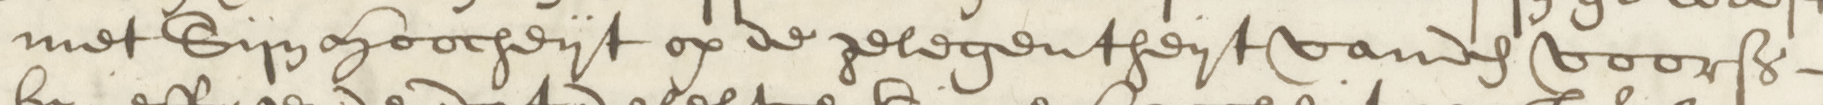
met Sijn Hoocheijt op de gelegentheijt vanden voorsz. —
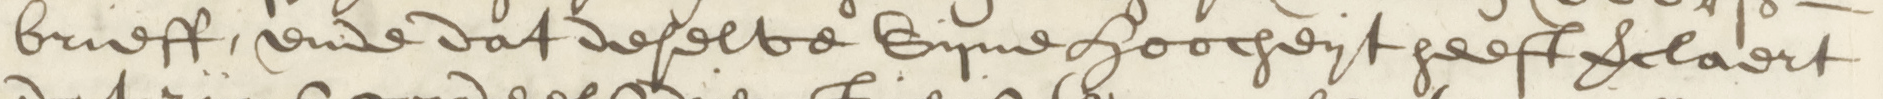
brieff, ende dat deselve Sijne Hoocheijt heeft &claert
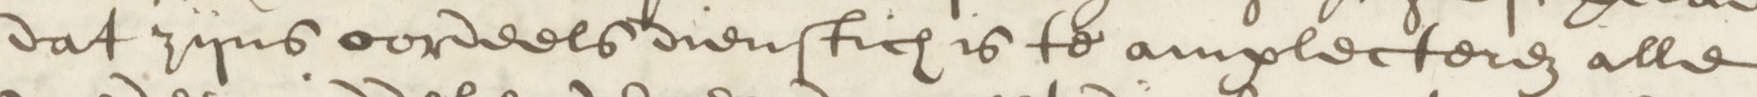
dat zijns oordeels dienstich is te amplecteren alle
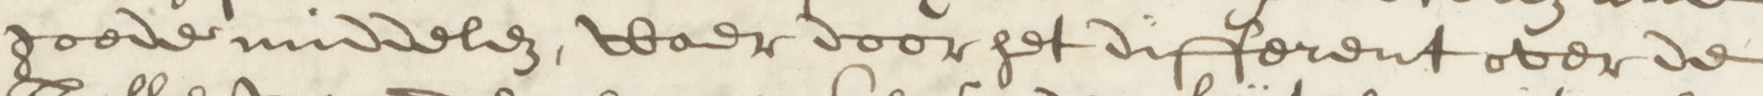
goede middelen, waer door het different over de
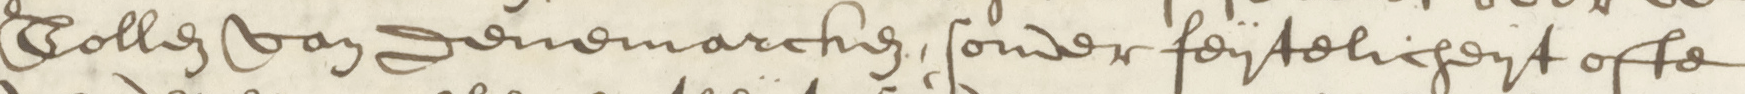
Tollen van Denemarcken sonder feijtelicheijt ofte
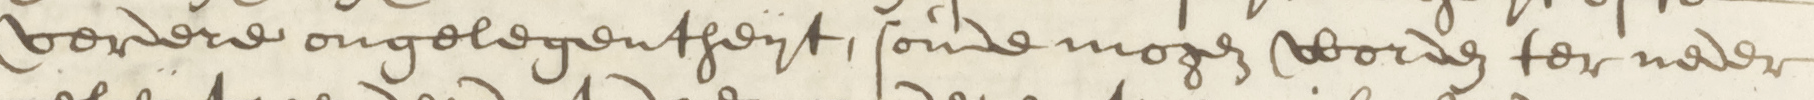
verdere ongelegentheijt, soude mogen worden ter neder
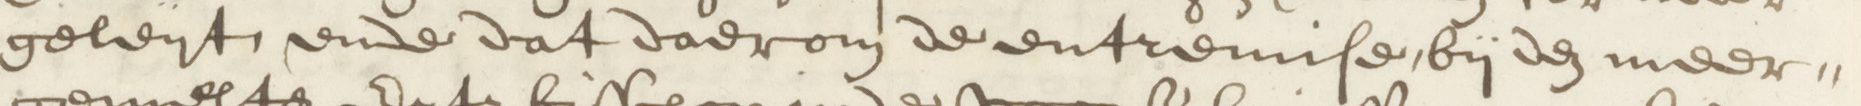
geleijt ende dat daerom de entremise, bij den meer„
